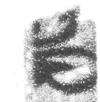矣
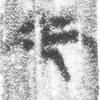夫
